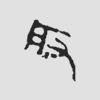取
